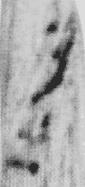道
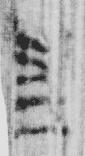爲
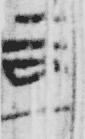可
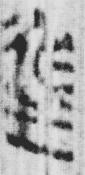道
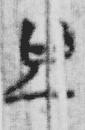也
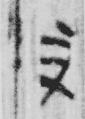凡
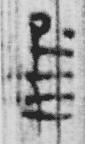甬（用）
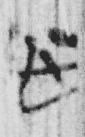心
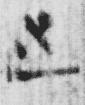之
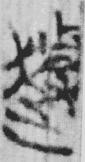○（弁）
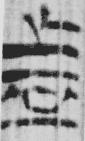者
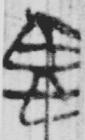思
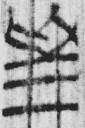爲
